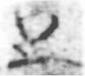之
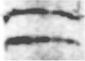二
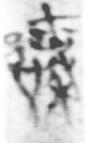○（秦）
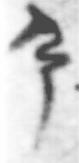弓
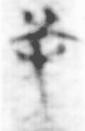矢
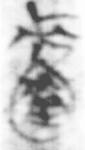○（箙）
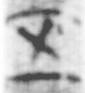五
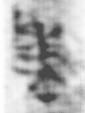秉
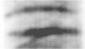二
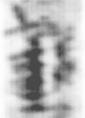載
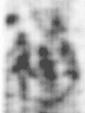紫
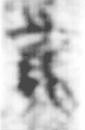黃
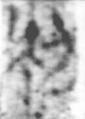紡
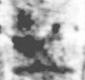之
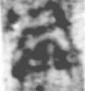綳
